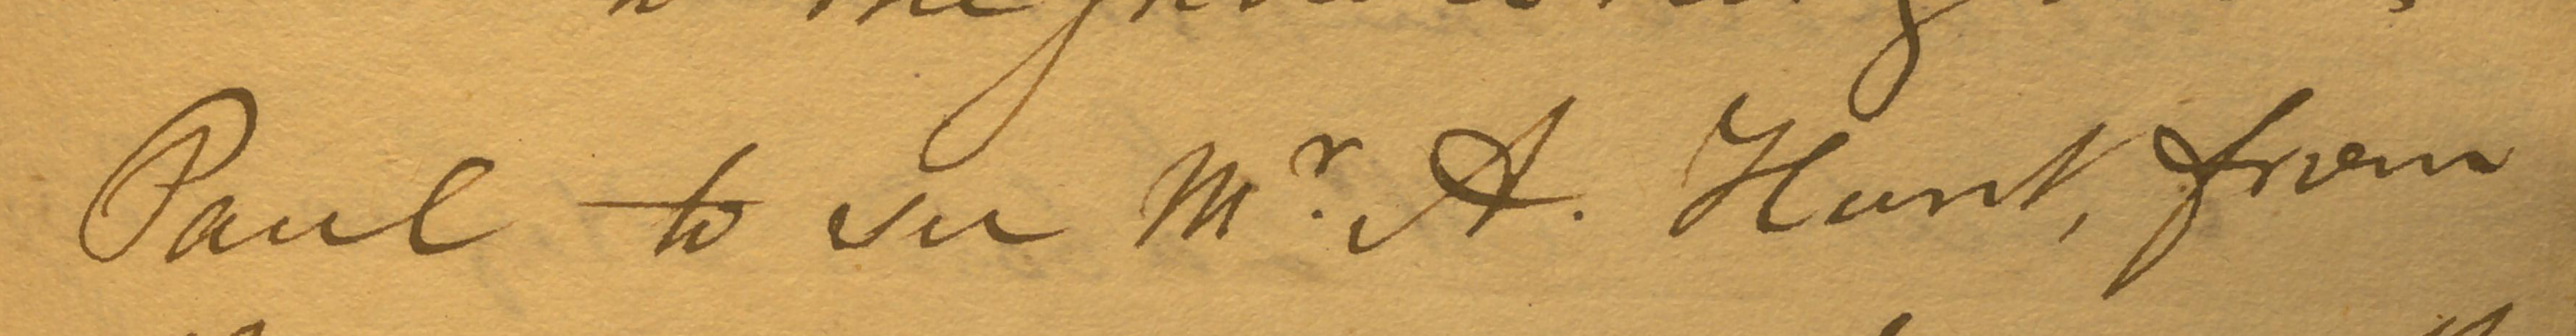Paul to see M^r. A. Hunt from
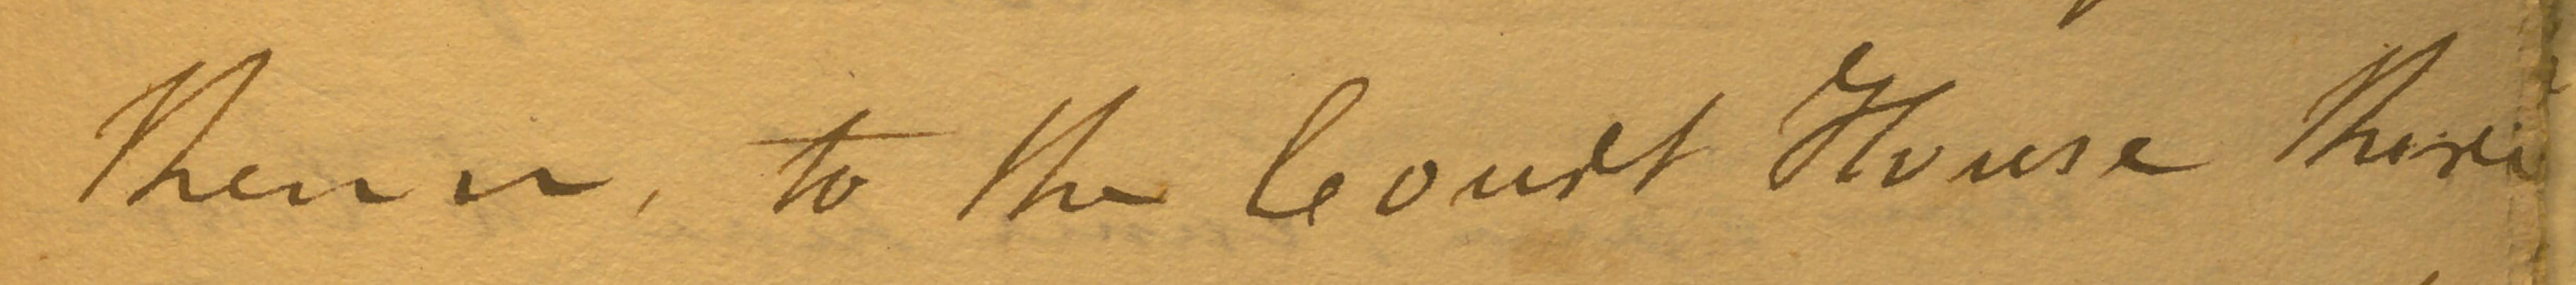thence, to the Court House there
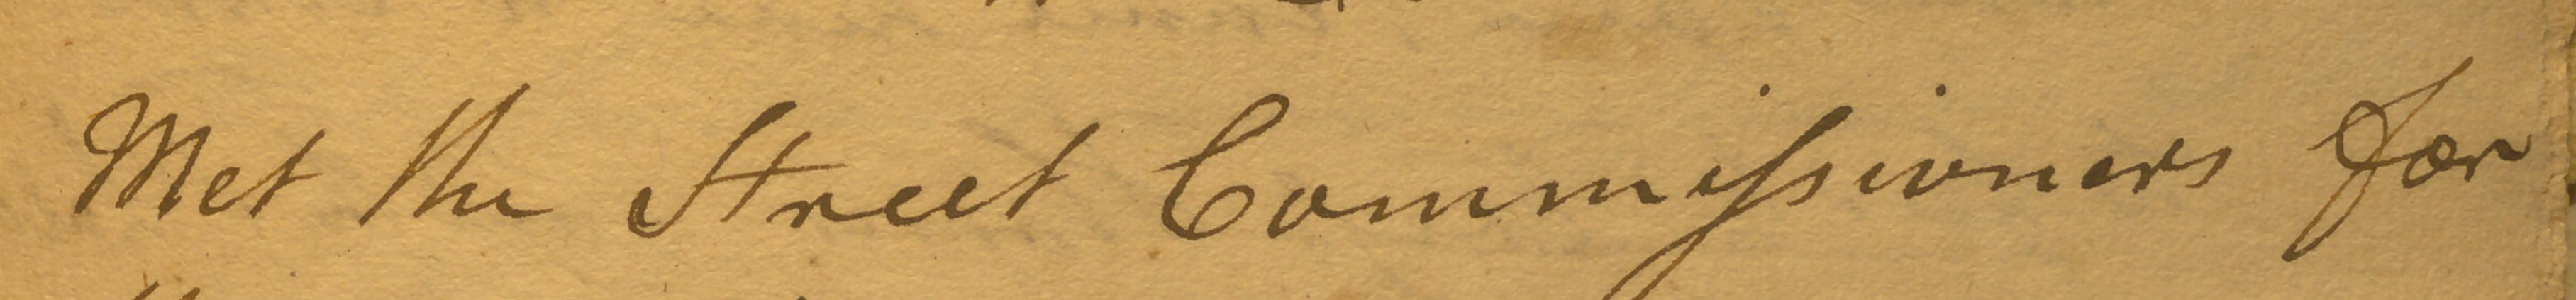Met the Street Commissioners for
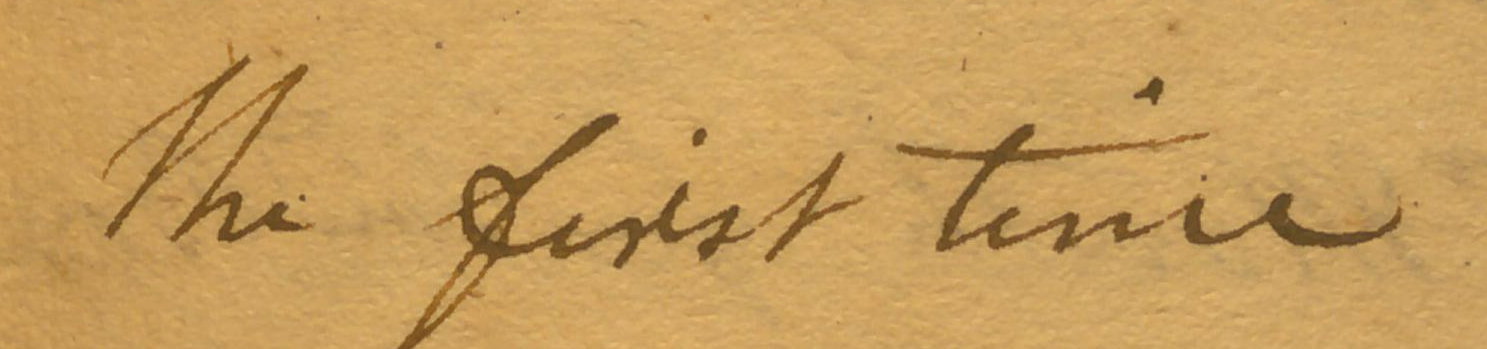the first time
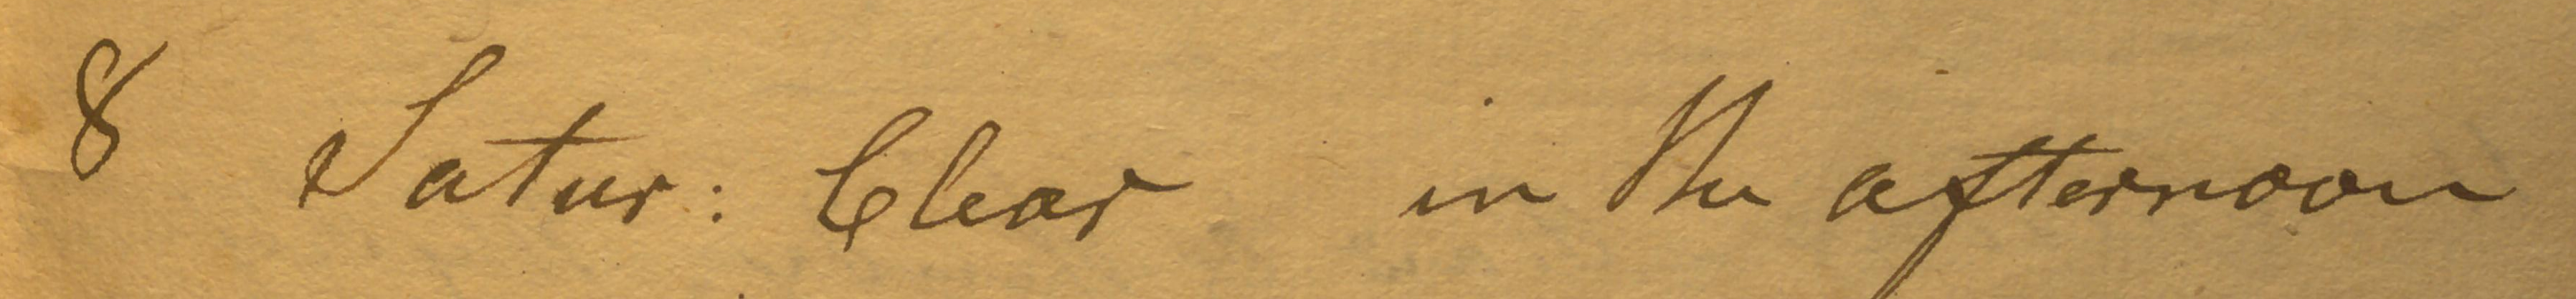8 Satur: Clear in the afternoon
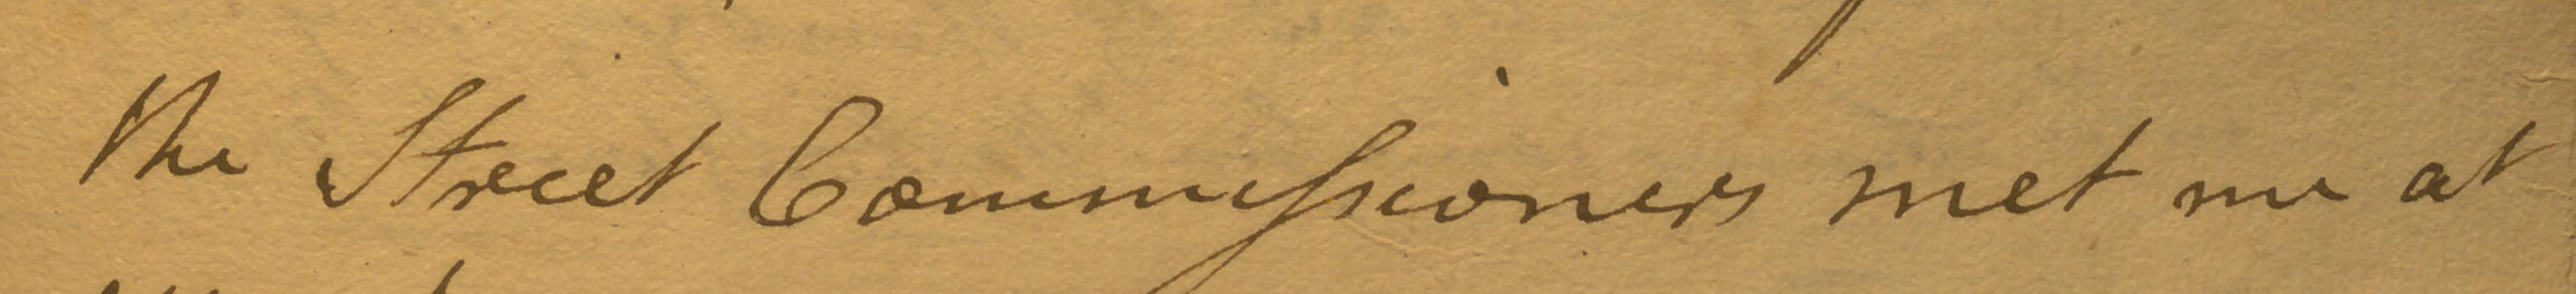the Street Commissioners met me at
